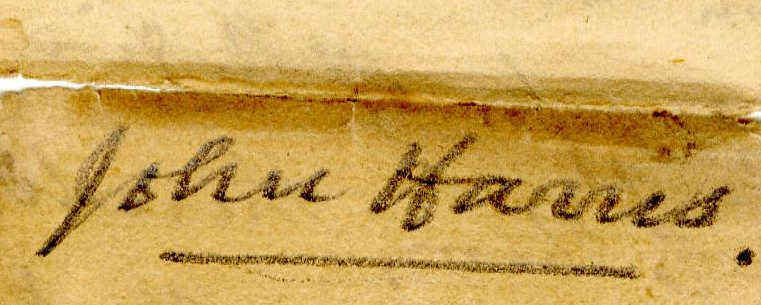John Harris
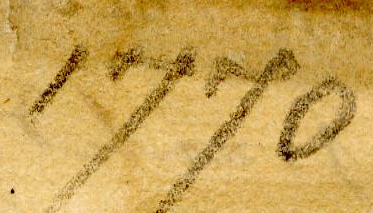1770
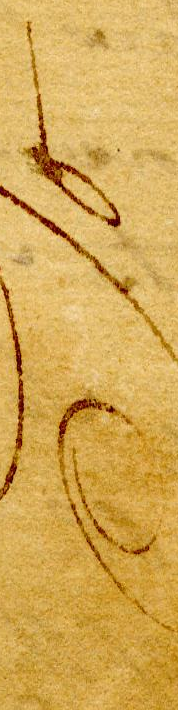To
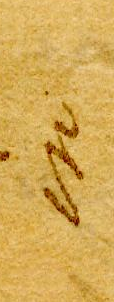in
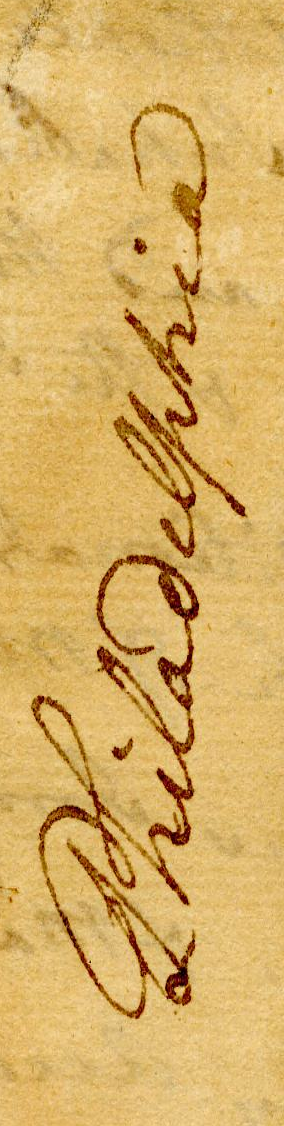Philadelphia
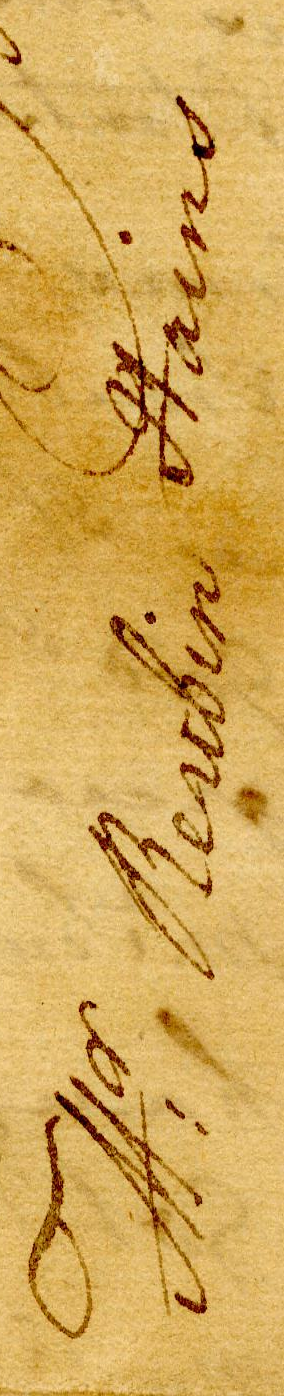M^r. Reubin Hains
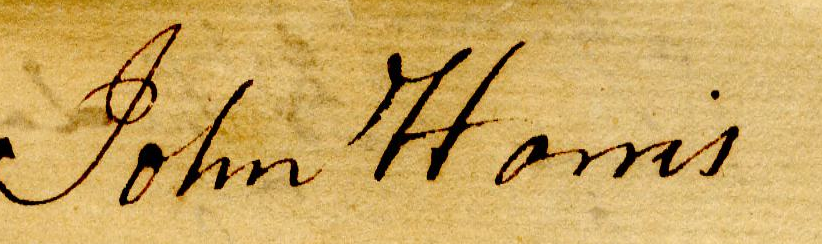John Harris
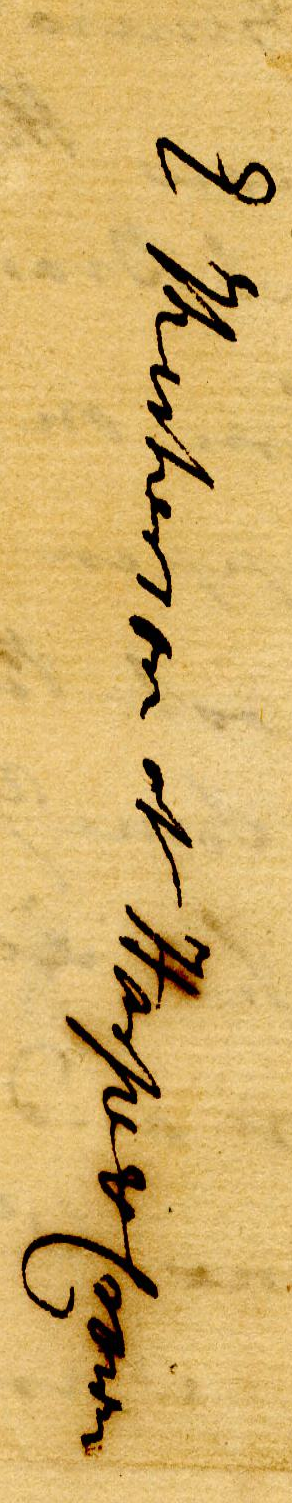E Rutherson at Harpe & Crown
